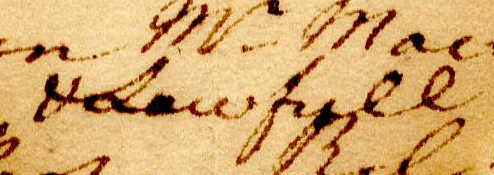& Lawfull
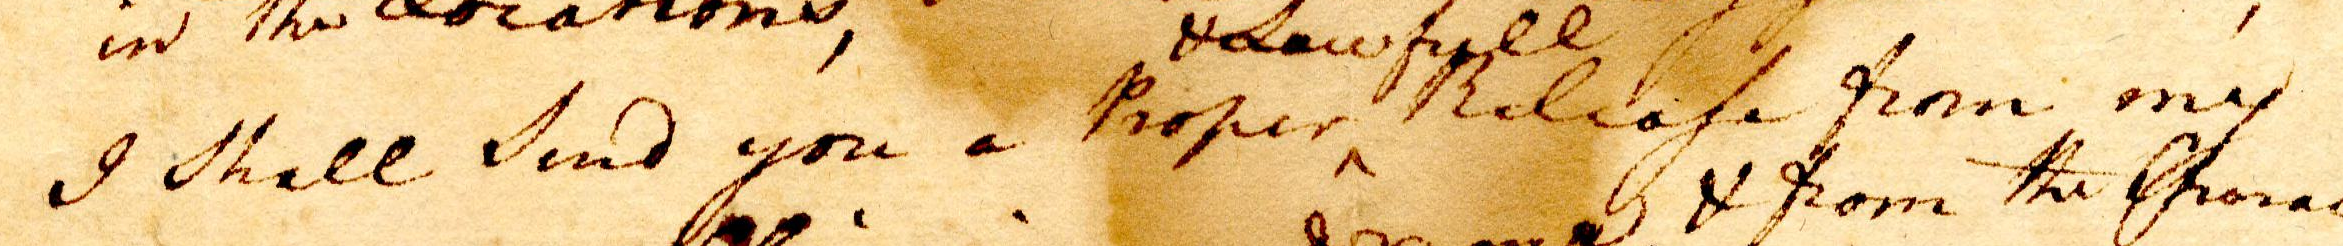I shall send you a Proper ^ Release from my
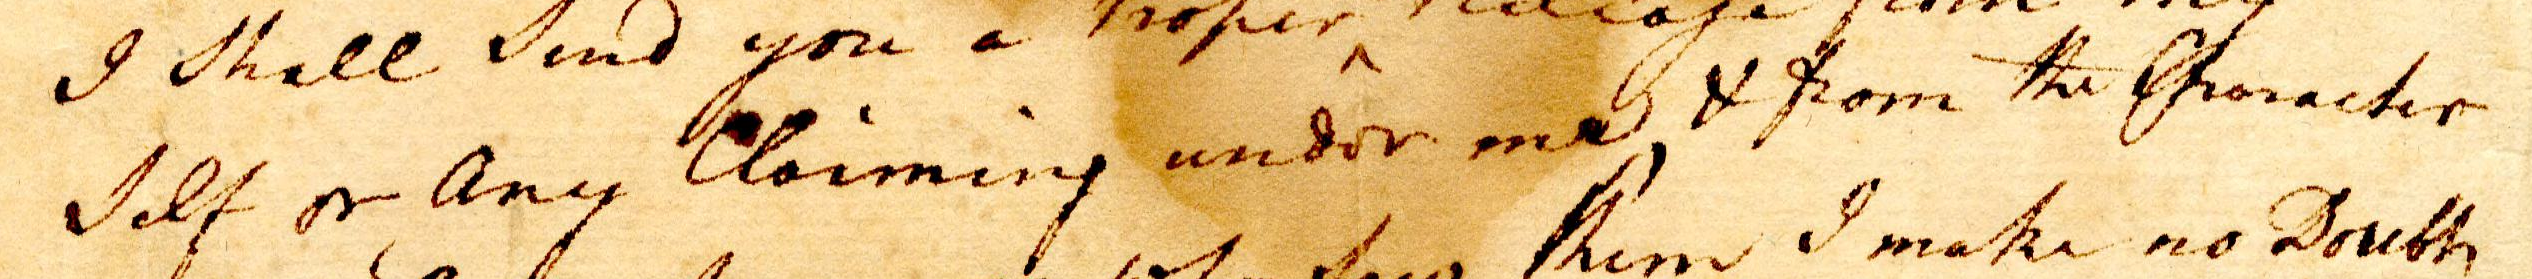self or any Claiming under me, & from the Character
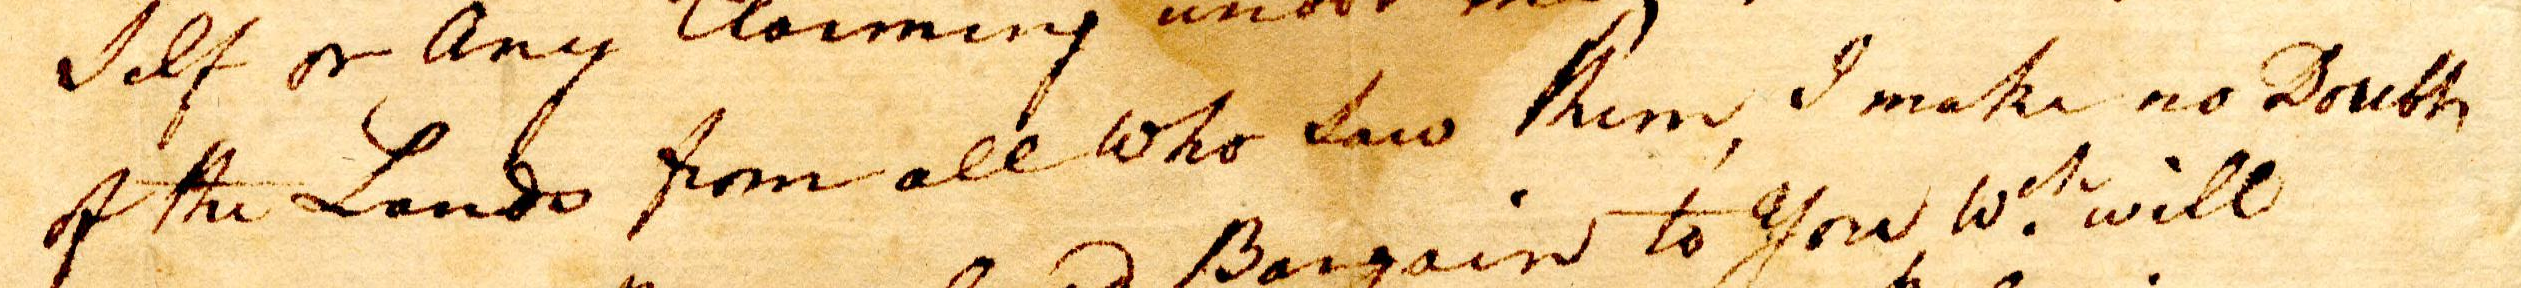of the Lands from all who Law them, I meak no Doubt
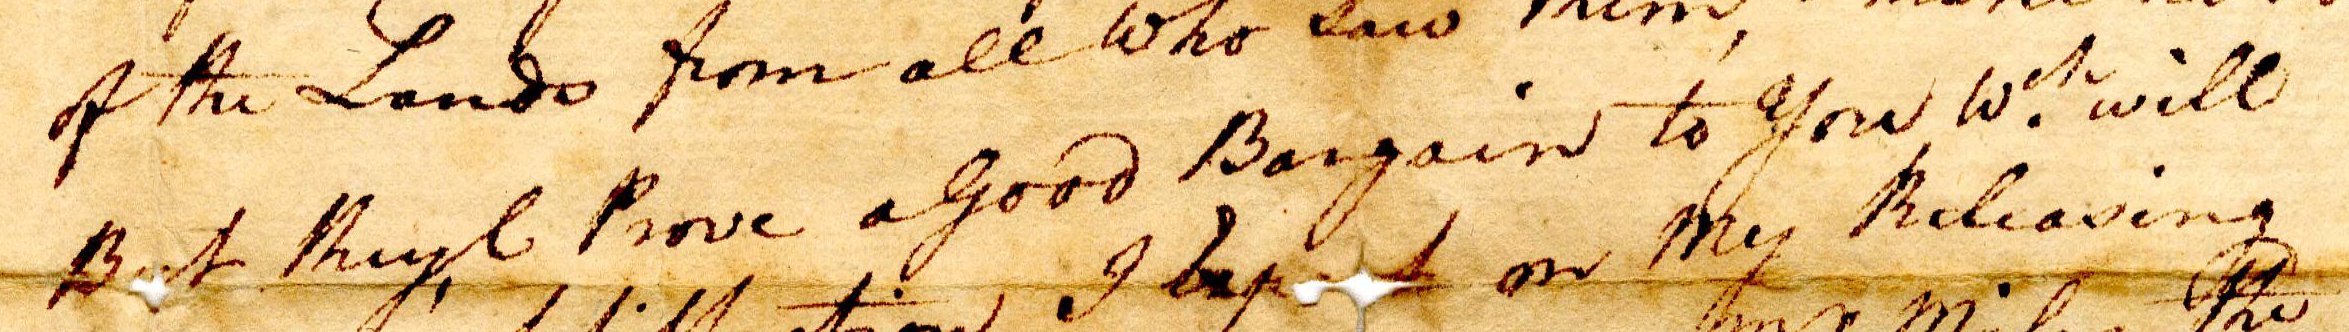But theyl Prove a Good Bargain to You w^ch. ill
